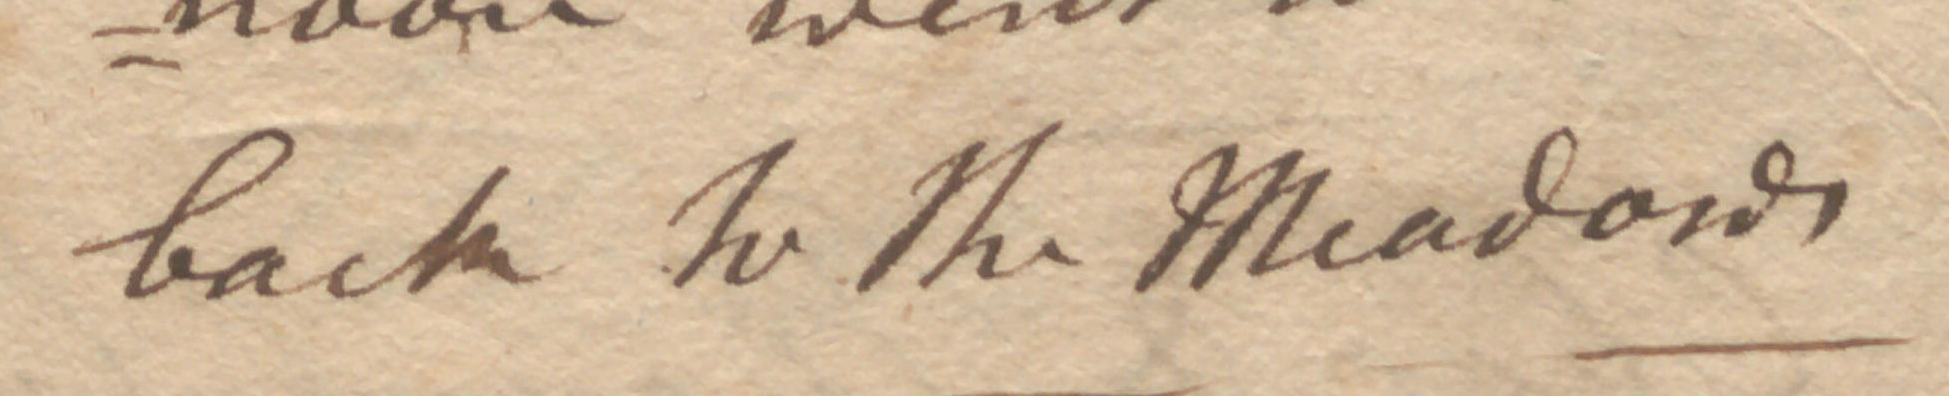back to the Meadows
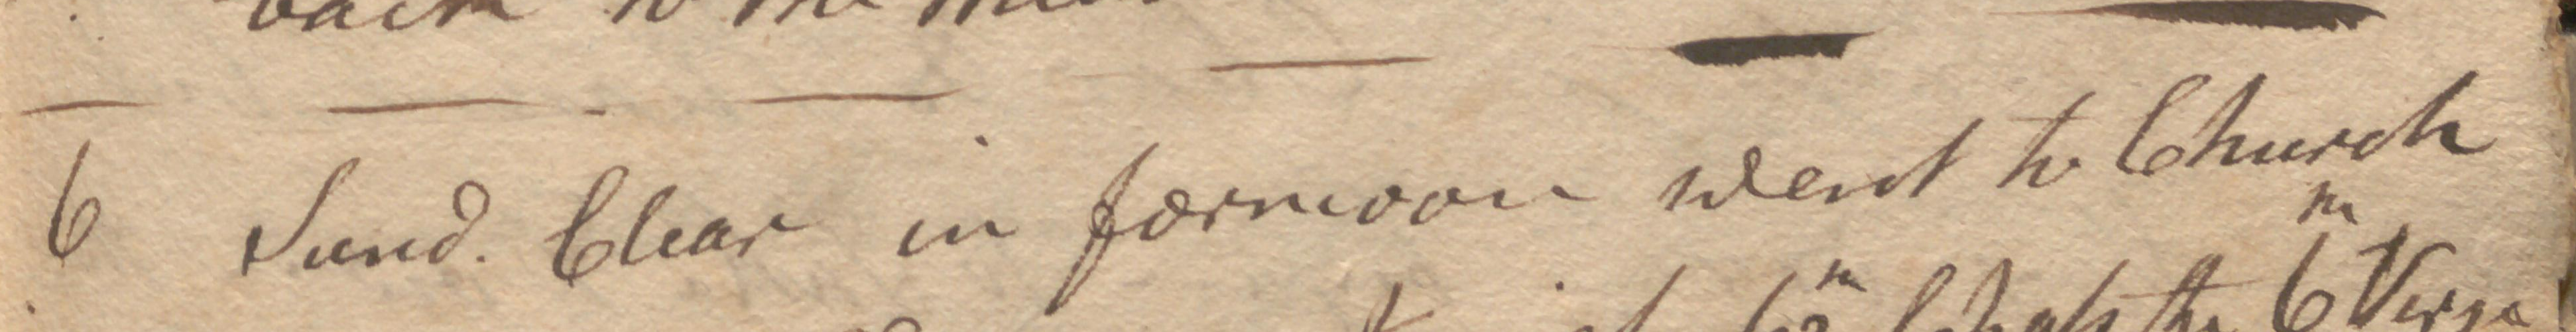6 Sund. Clear in fornoon went to Church
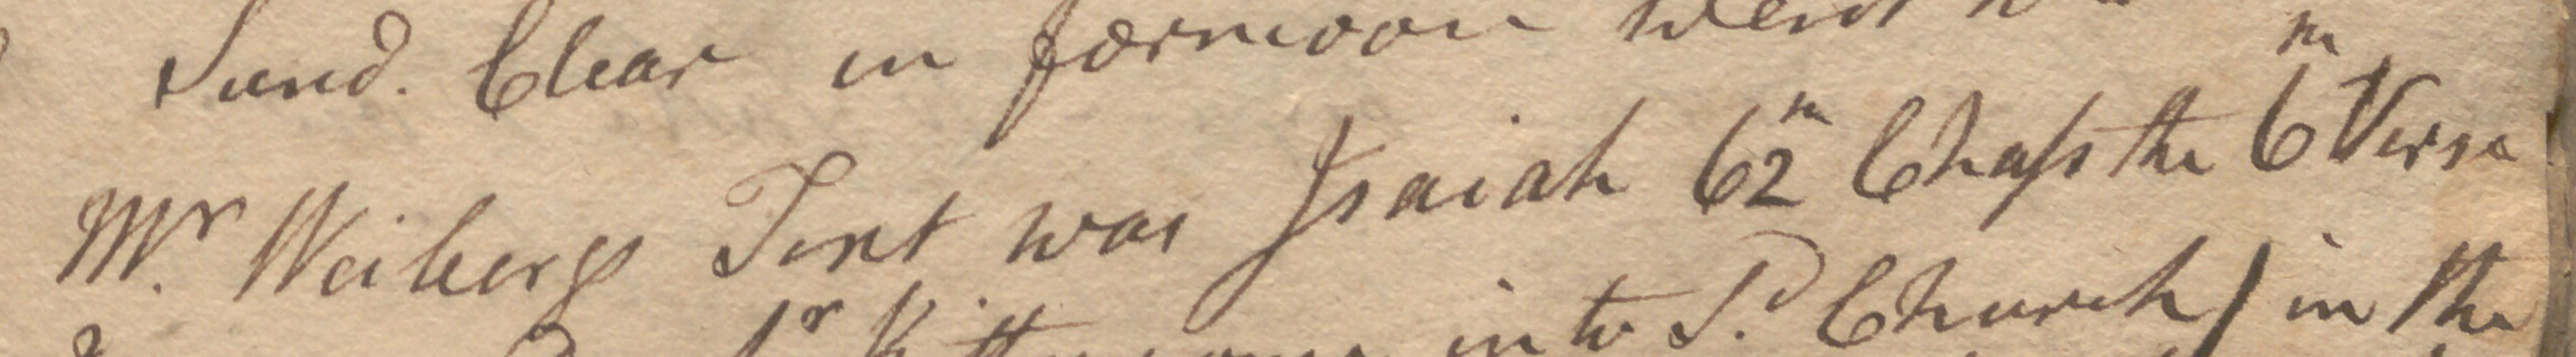M^r. Weibergs Text was Isaiah 62^th Chap the 6^th Verse
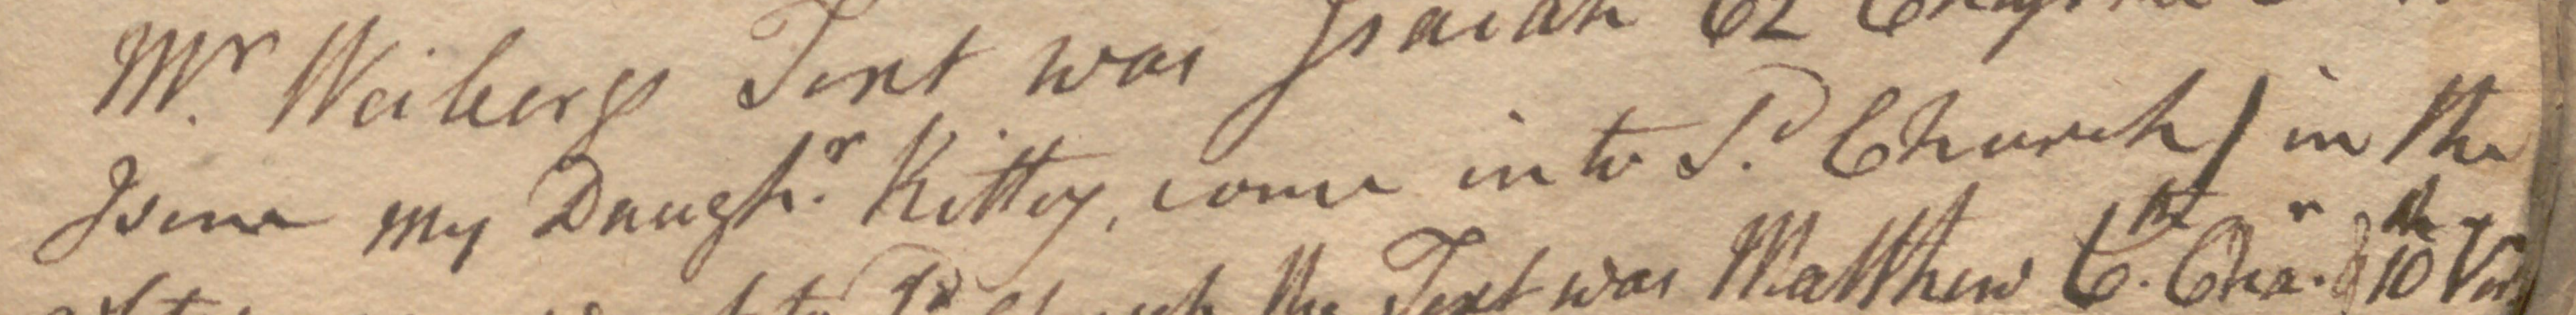I seen my Daugh^r. Kittey come into s^d. Church) in the
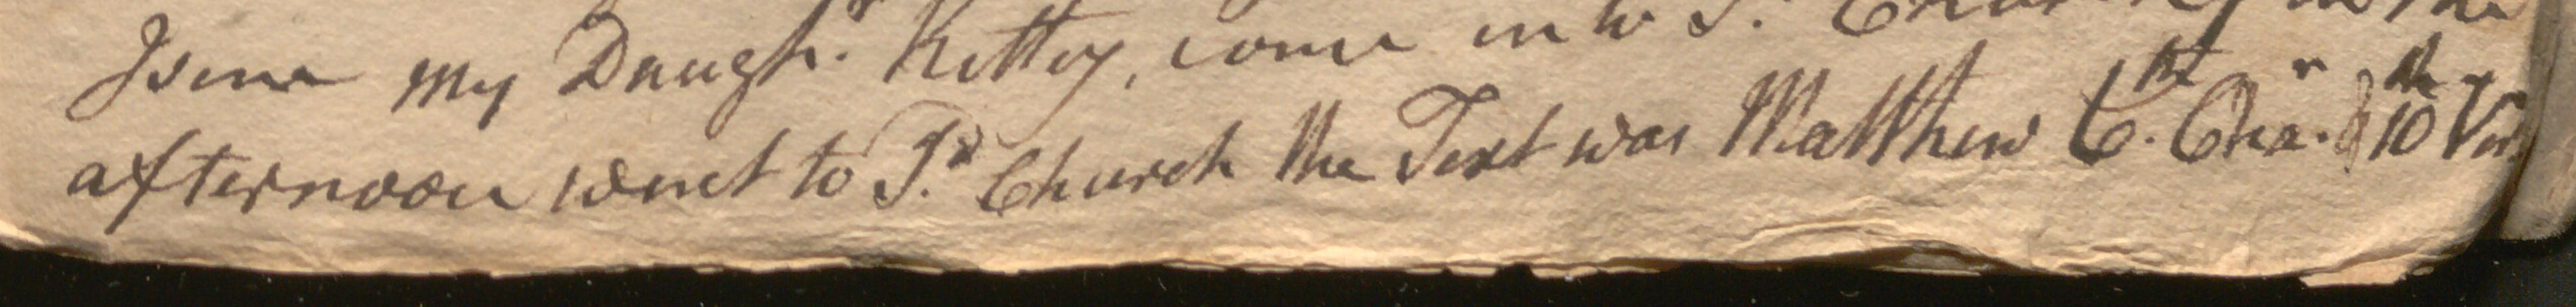afternoon went to s^d. Curch the Text was Matthew 6^th Cha^r. & 10^th Ver
